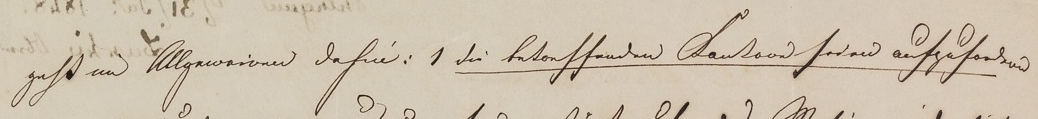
geht im Allgemeinen dahin: 1. die betreffenden Kantone seien aufzufordern
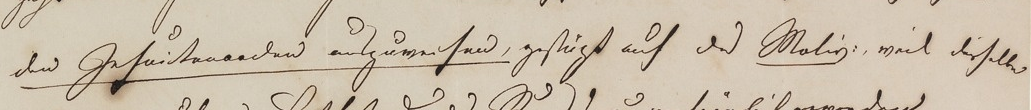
den Jesuitenorden auszuweisen, gestüzt auf das Motiv: weil derselbe
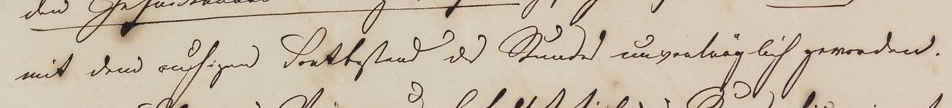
mit dem ruhigen Fortbestand des Bundes unverträglich geworden.
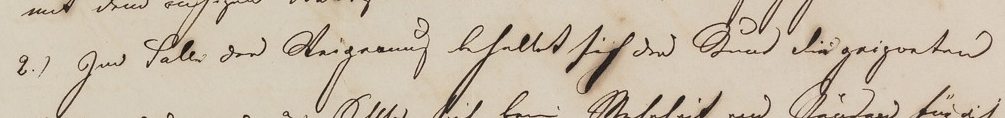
2.) Im Falle der Weigerung behaltet sich der Bund die geigneten
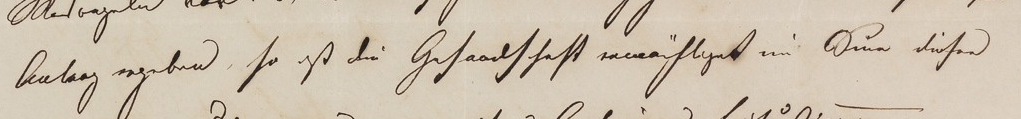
Antrag ergeben, so ist die Gesandschaft ermächtiget im Sinne dieser
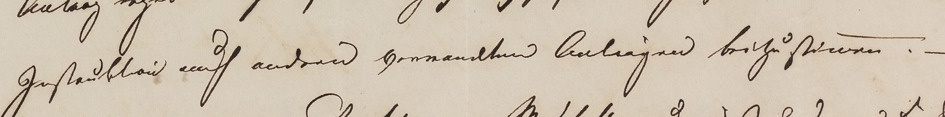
Instruktion auch andern verwandten Anträgen beizustimmen. –
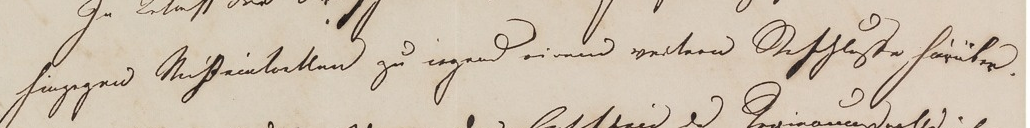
hingegen Nichteintretten zu irgend einem weiteren Beschlusse hierüber.
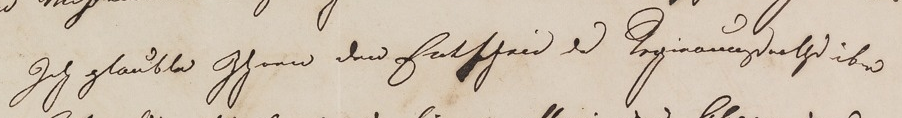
– Ich glaubte Ihnen den Entscheid des Regierungsraths über
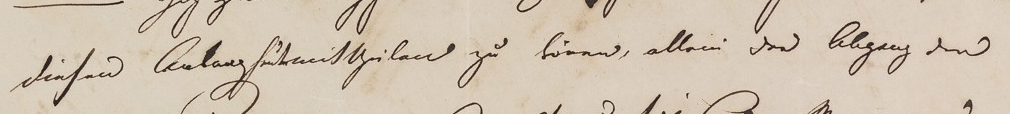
diesen Antrag heute mittheilen zu könen, allein der Abgang der
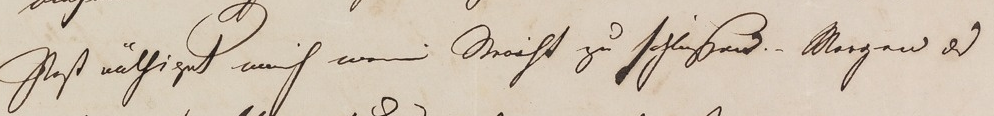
Post nöthiget mich meinen Bericht zu schließen. Morgen das
